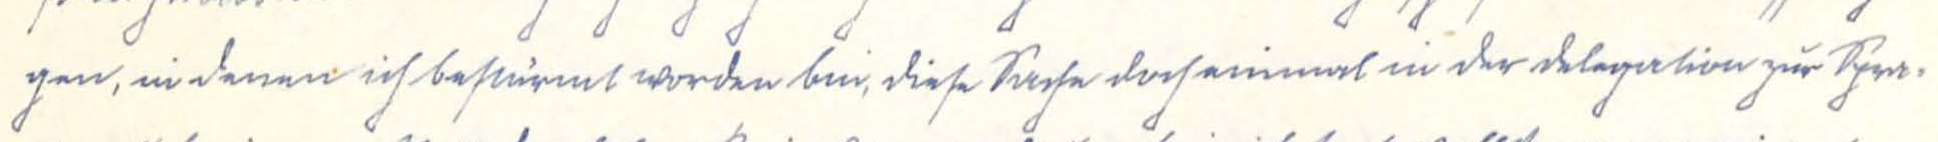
gen, in denen ich bestürmt worden bin, diese Sache doch einmal in der Delegation zur Spra-
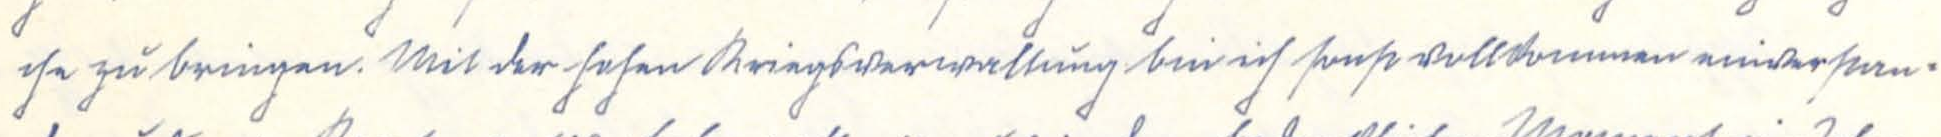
che zu bringen. Mit der hohen Kriegsverwaltung bin ich sonst vollkommen einverstan-
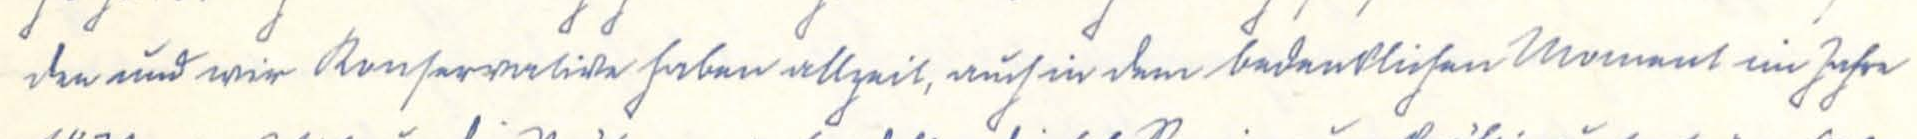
den und wir Konservative haben allzeit, auch in dem bedenklichen Moment im Jahre
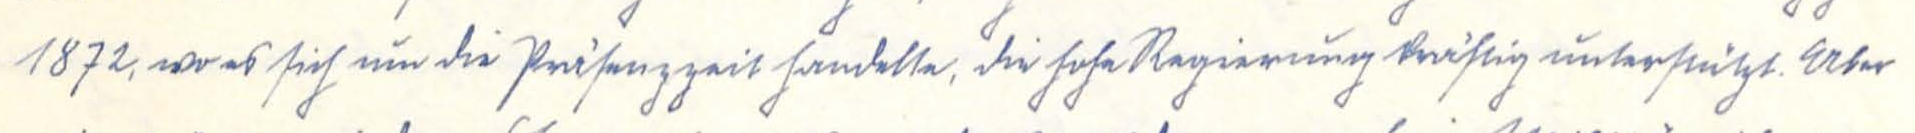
1872, wo es sich um die Präsenzzeit handelte, die hohe Regierung kräftig unterstützt. Aber
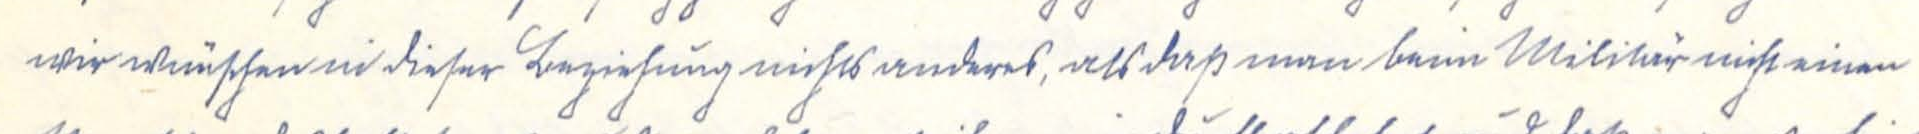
wir wünschen in dieser Beziehung nichts anderes, als daß man beim Militär nicht einen
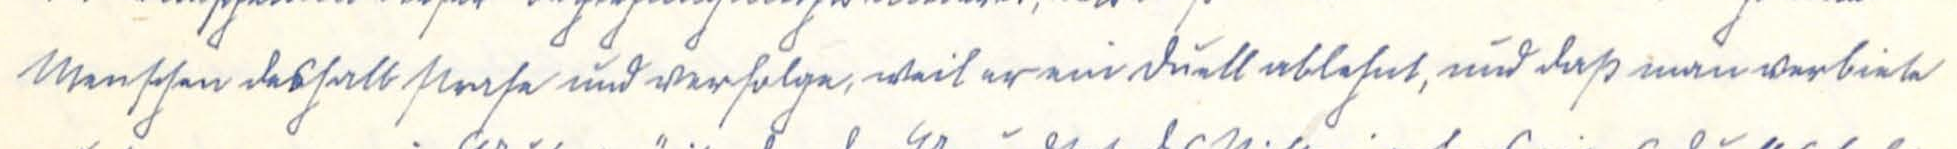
Menschen deshalb strafe und verfolge, weil er ein Duell ablehnt, und daß man verbietet
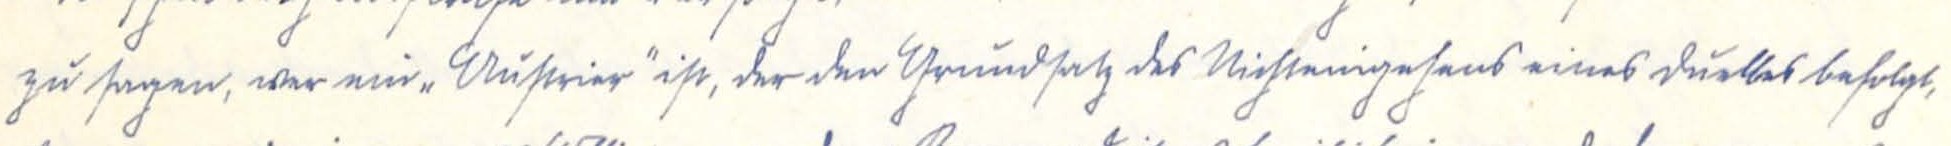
zu sagen, wer ein „Austrier“ ist, der den Grundsatz des Nichteingehens eines Duelles befolgt,
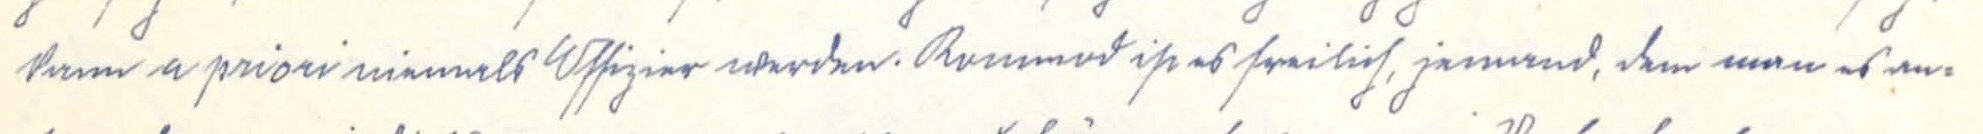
kann a priori niemals Offizier werden. Kommod ist es freilich, jemand, dem man es an-
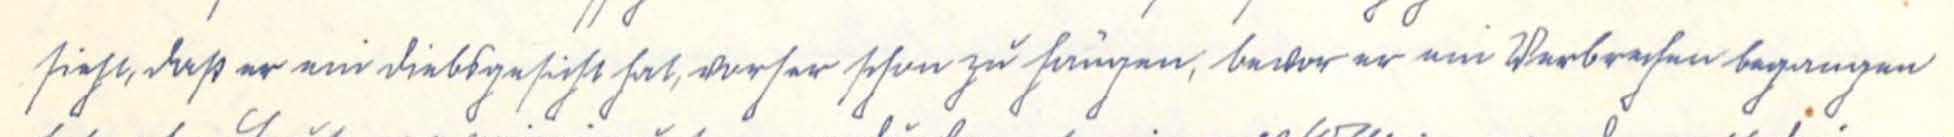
sieht, dass er ein Diebsgesicht hat, vorher schon zu hängen, bevor er ein Verbrehen begangen
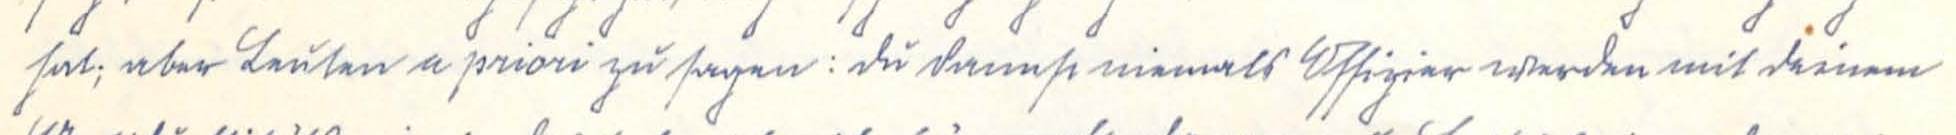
hat; aber Leuten a priori zu sagen: Du kannst niemals Offizier werden mit deinem
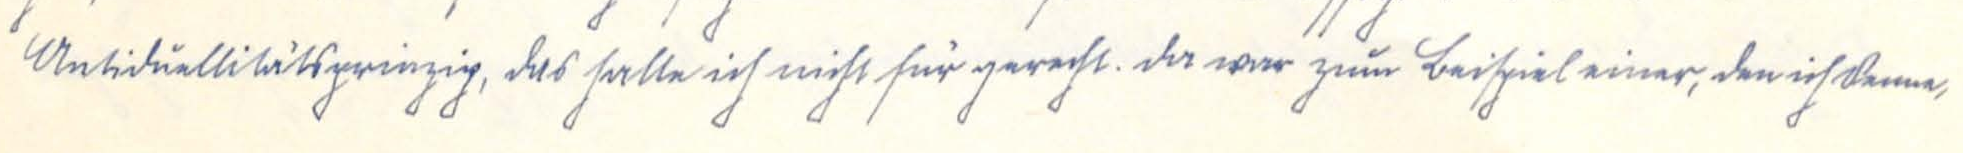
Antiduellitätsprinzip, das halte ich nicht für gerecht. Da war zum Beispiel einer, den ich kenne,
